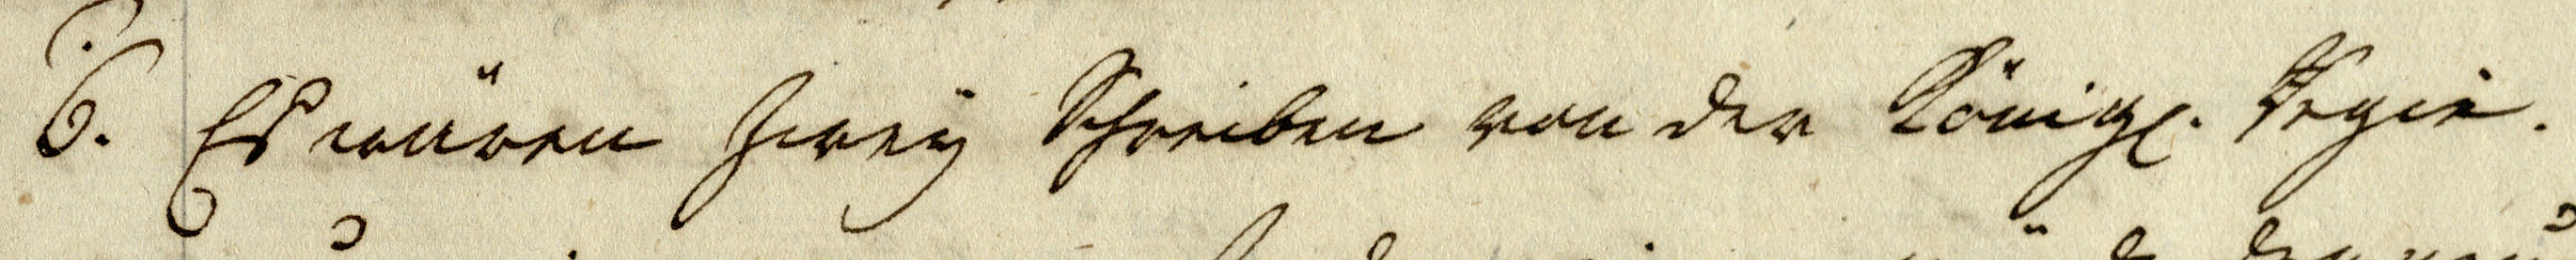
6. Es wären zweÿ Schreiben von der Königl. Regie¬
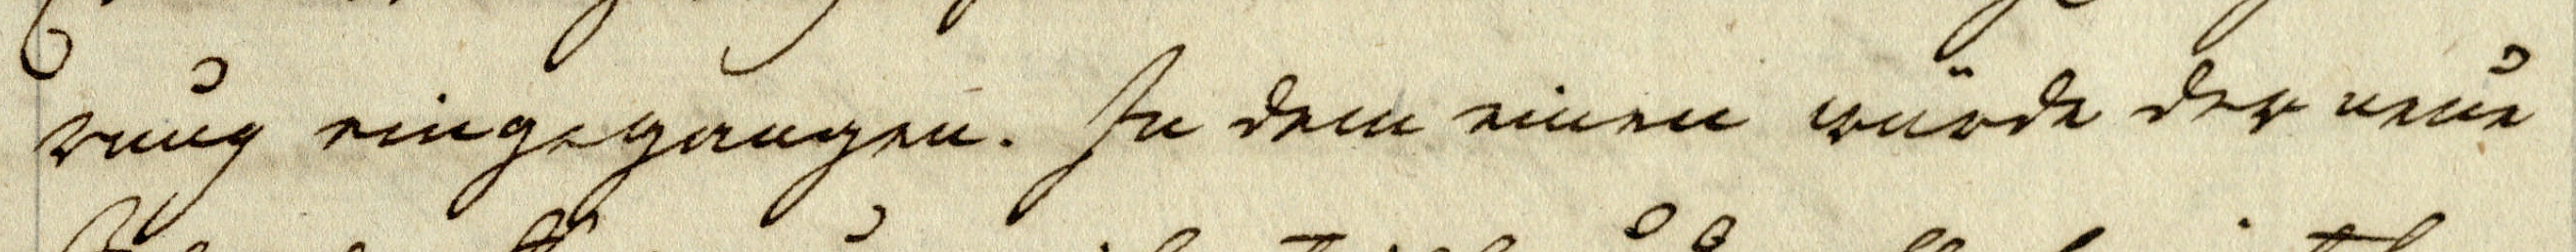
rung eingegangen. In dem einen würde der neue
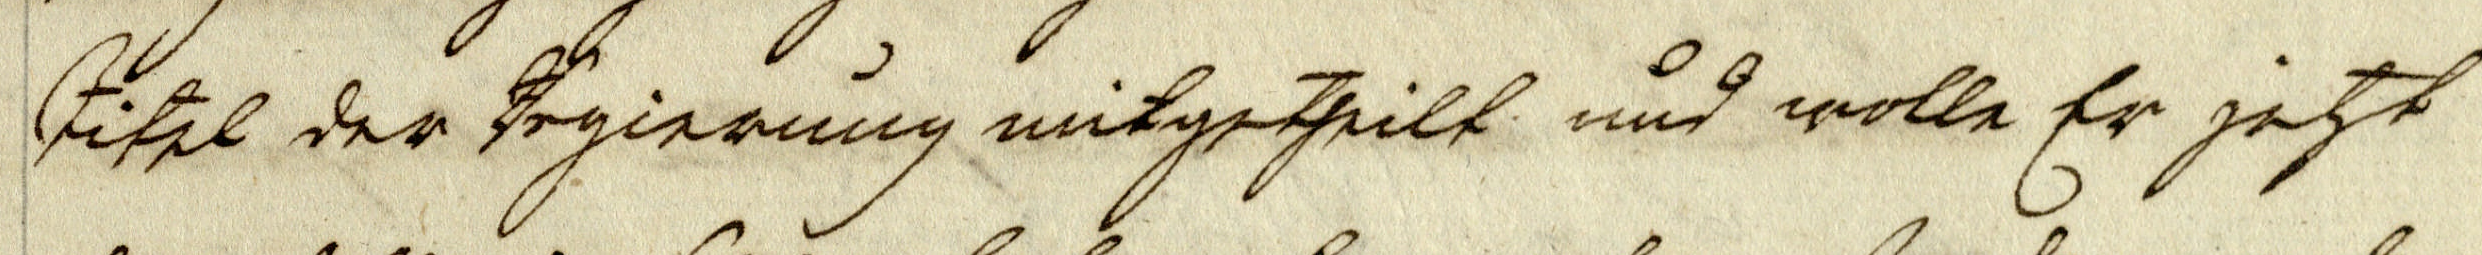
Titel der Regierung mitgetheilt und wolle Er jetzt
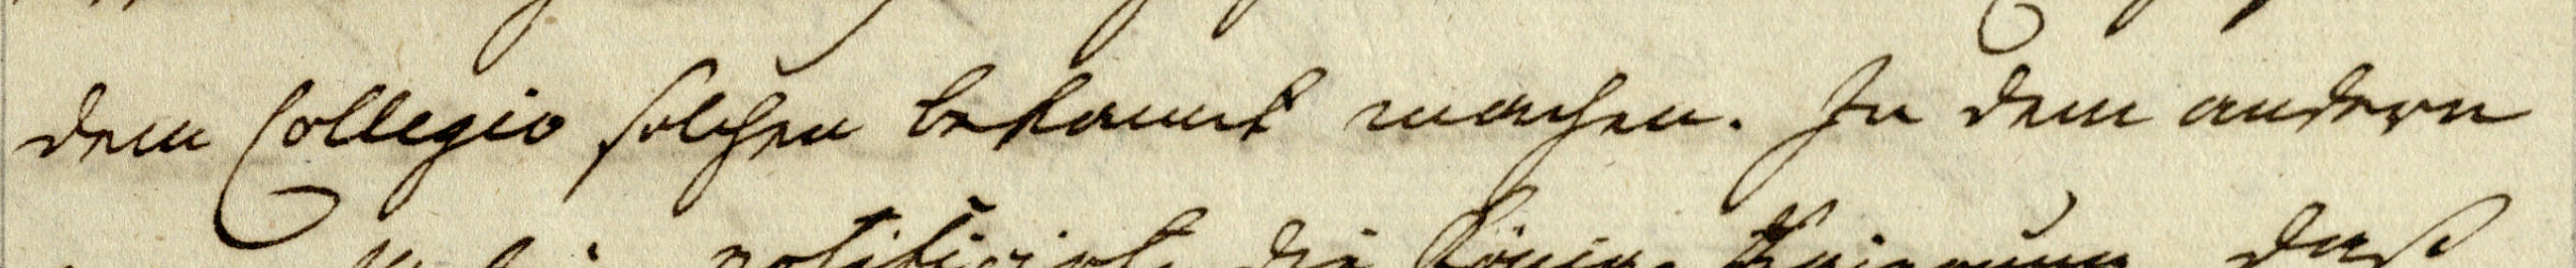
dem Collegio solchen bekannt machen. In dem andern
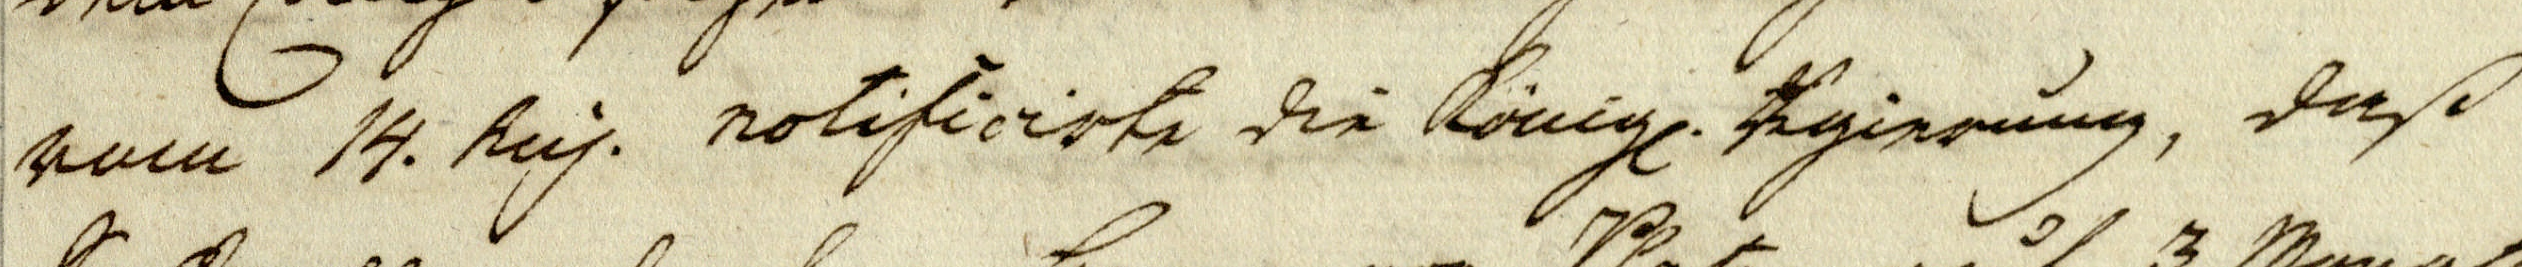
vom 14. huj. notificirte die Königl. Regierung, daß
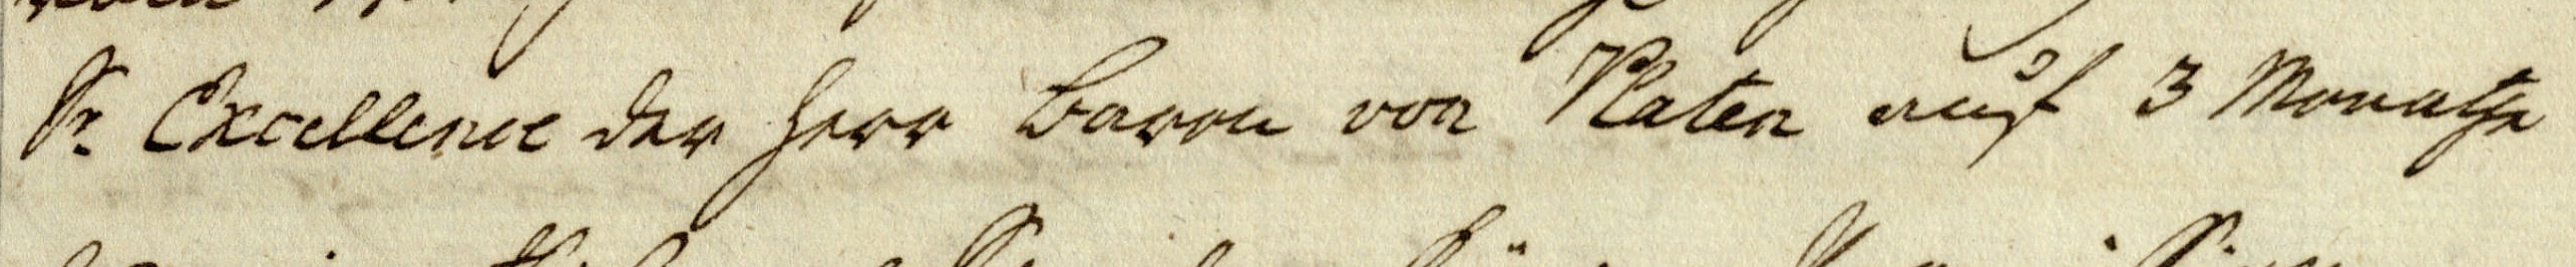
Sr Excellence der Herr Baron von Platen auf 3 Monathe
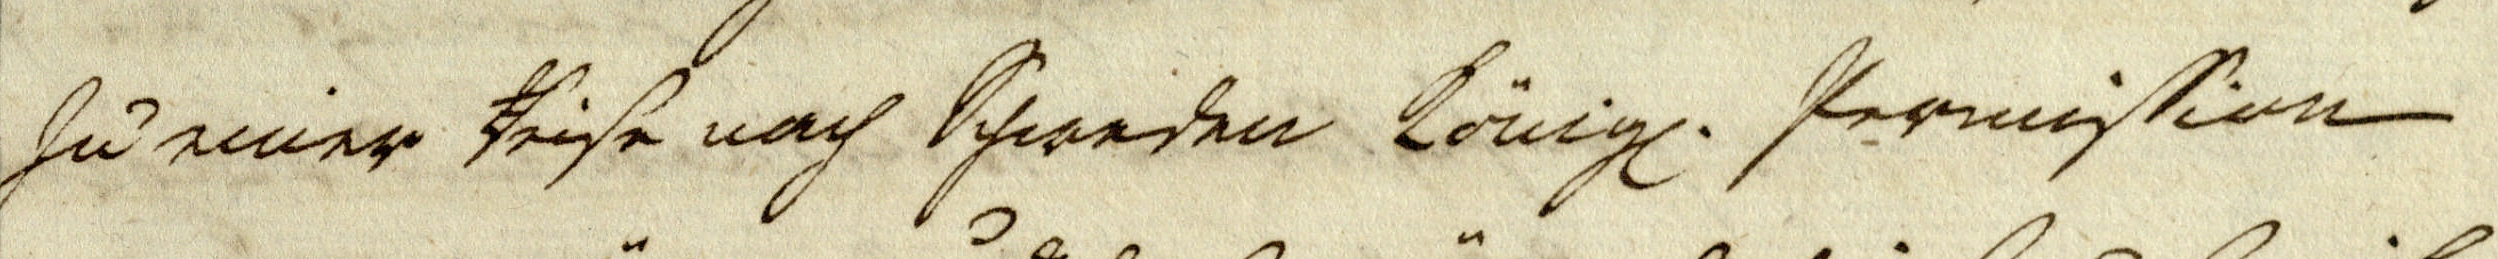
zu einer Reise nach Schweden Königl. Permission
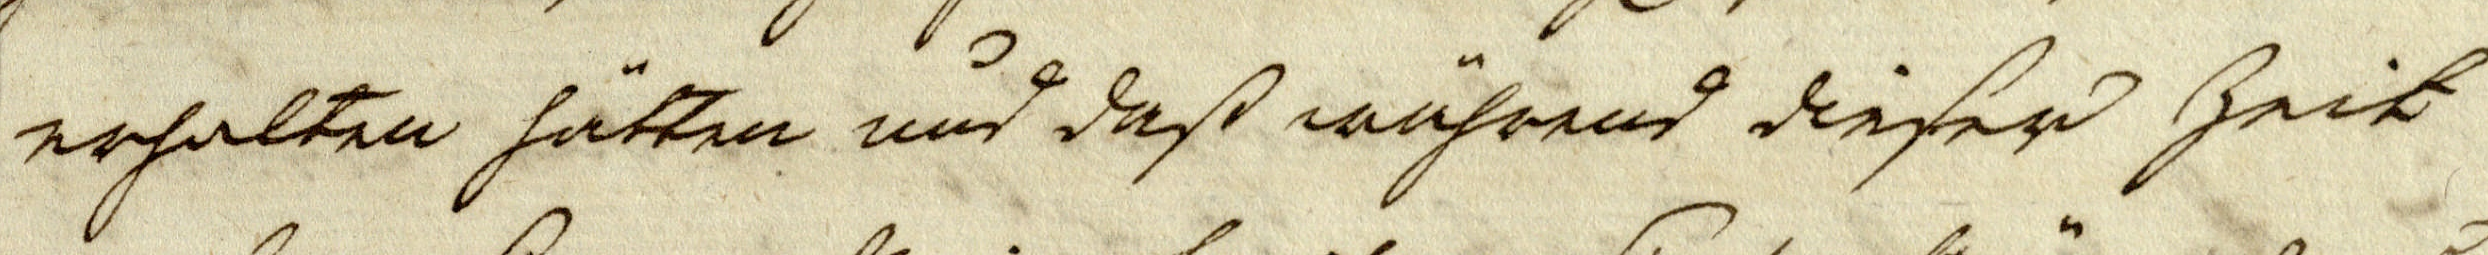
erhalten hätten und daß während dieser Zeit
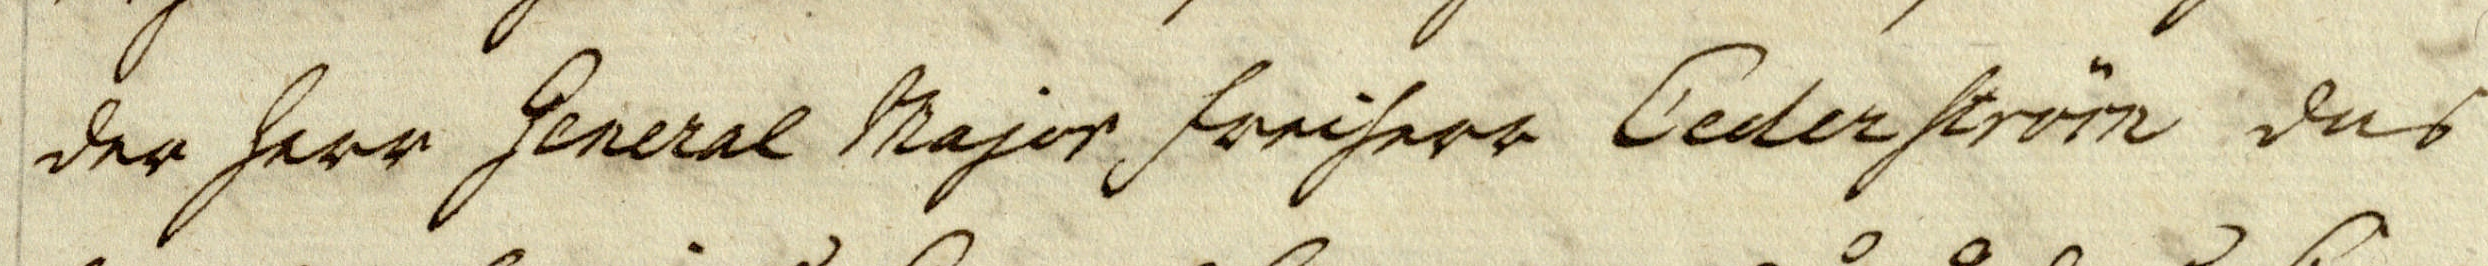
der Herr General Major Freiherr Cederström das
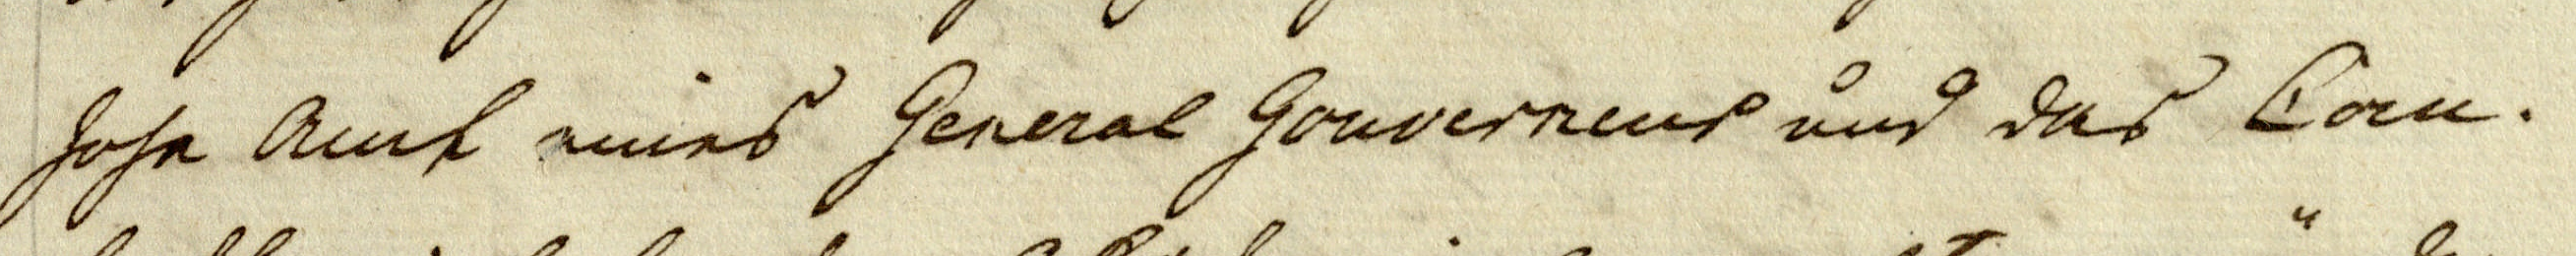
hohe Amt eines General Gouverneur und das Can¬
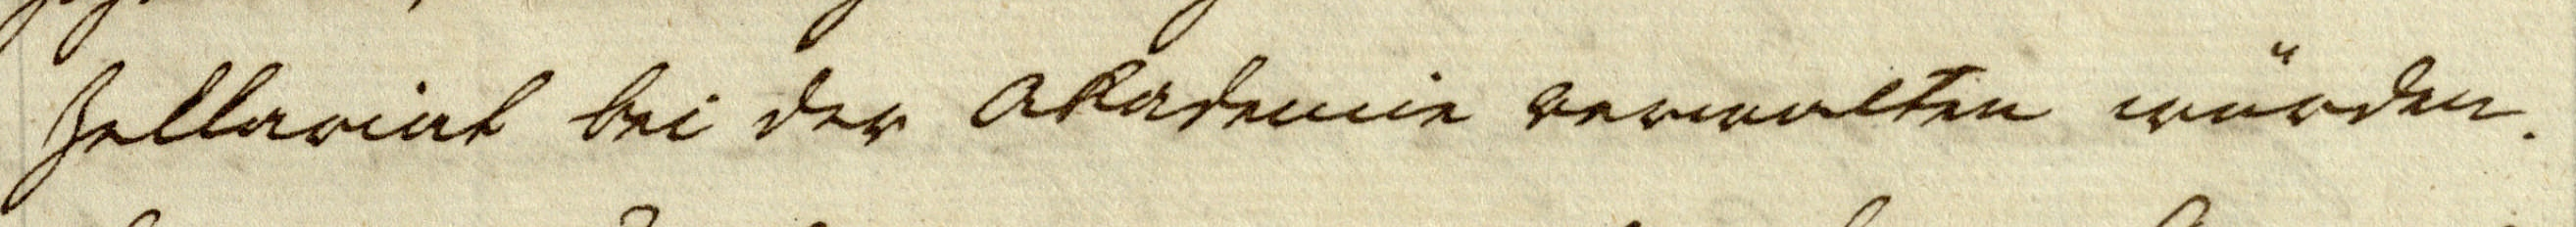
zellariat bei der Akademie verwalten würden.
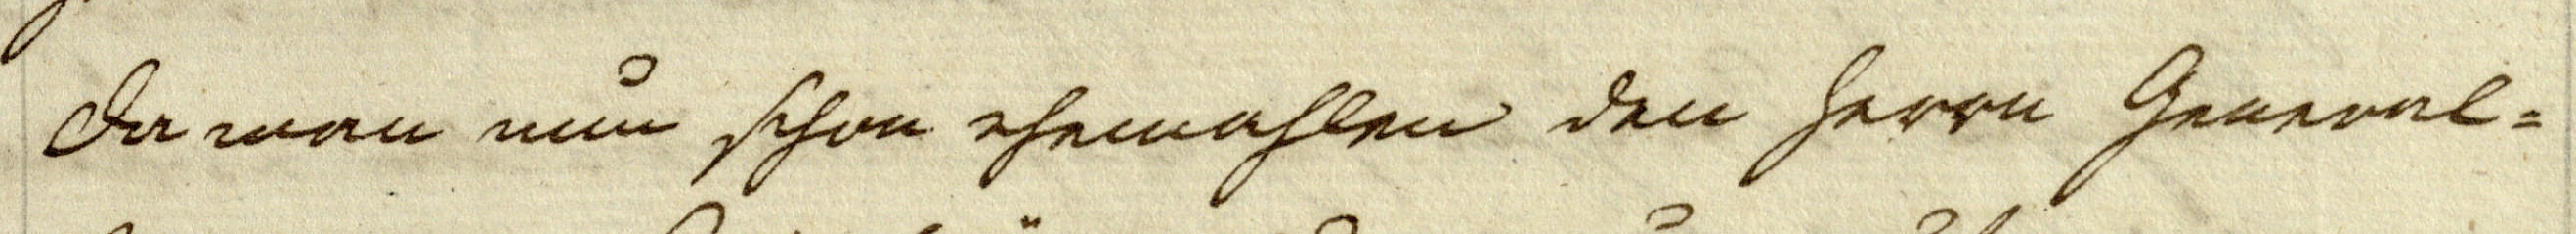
Da man nun schon ehemahlen den Herrn General-
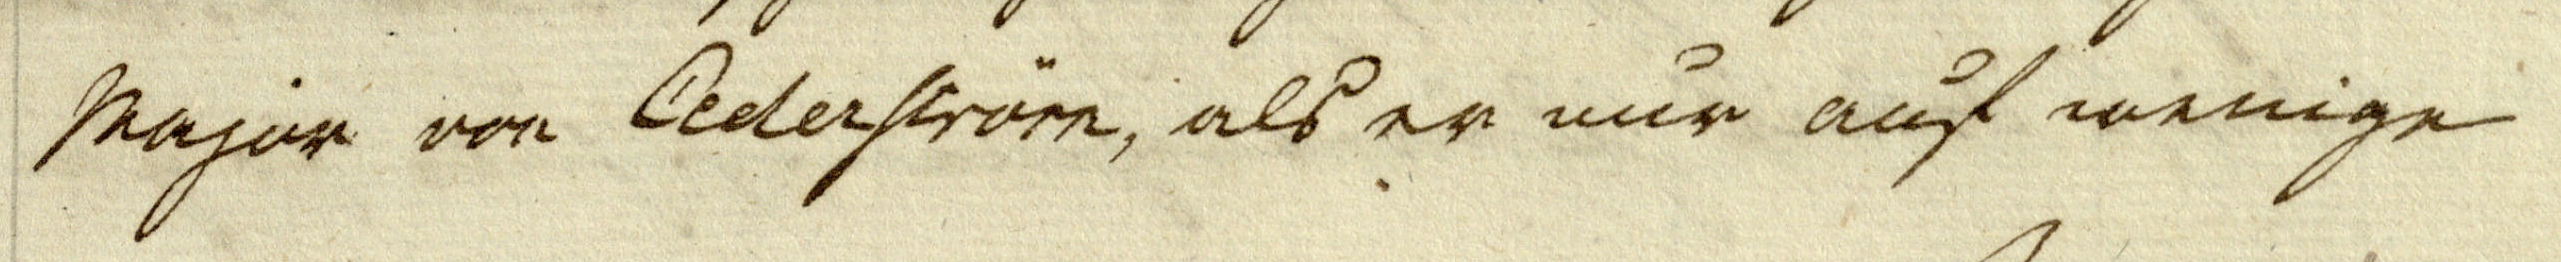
Major von Cederström, als er nur auf wenige
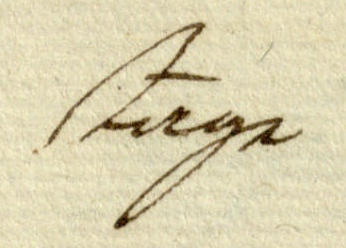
Tage
